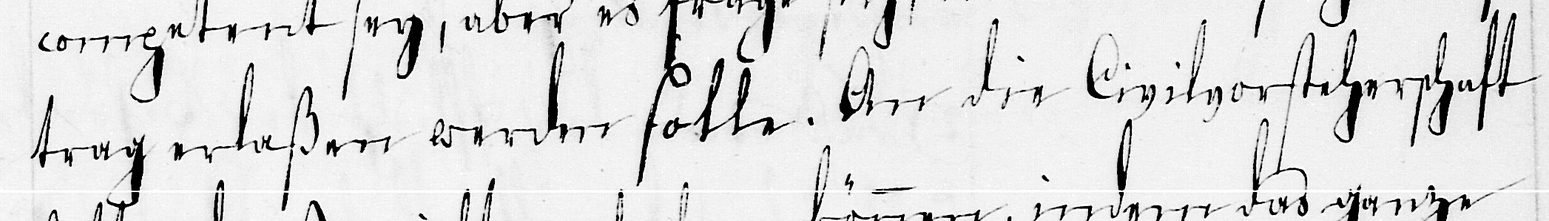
trag erlaßen werden solle. An die Civilvorsteherschaft
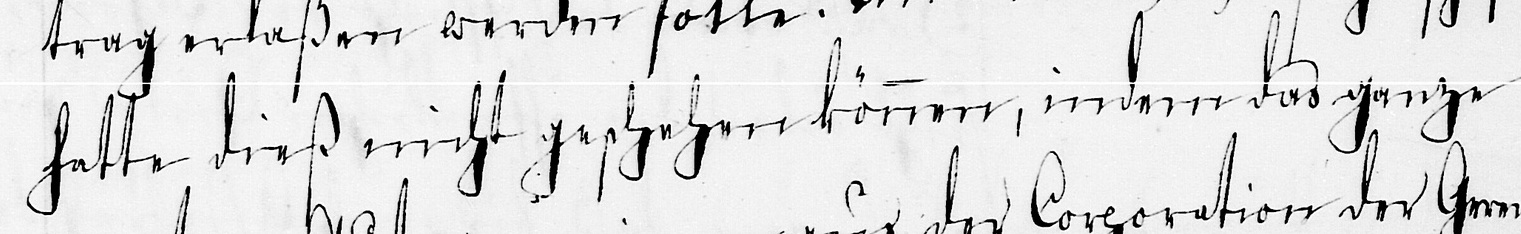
hatte dieß nicht geschehen können, indem das ganze
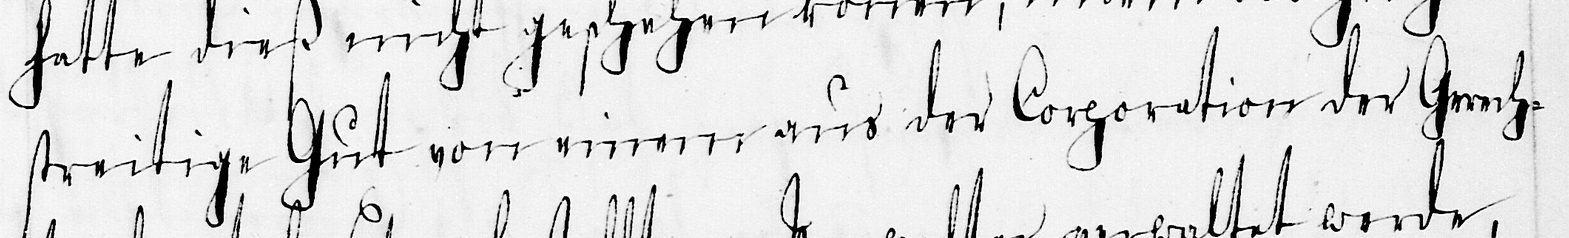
streitige Gut von einem aus der Corporation der Gerech¬
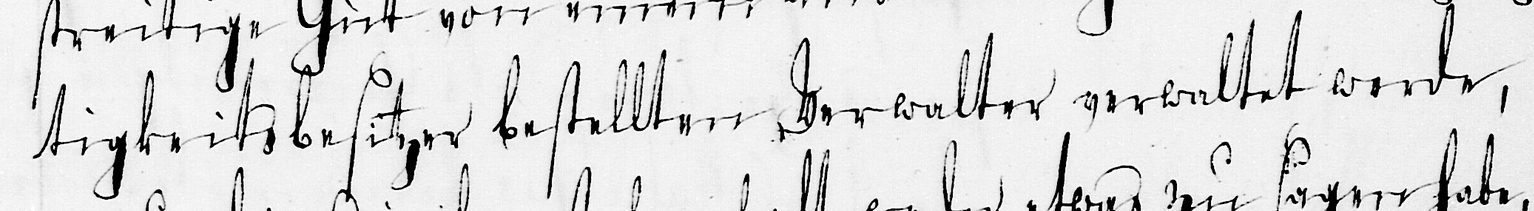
tigkeitsbesitzer bestellten Verwalter verwaltet werde,
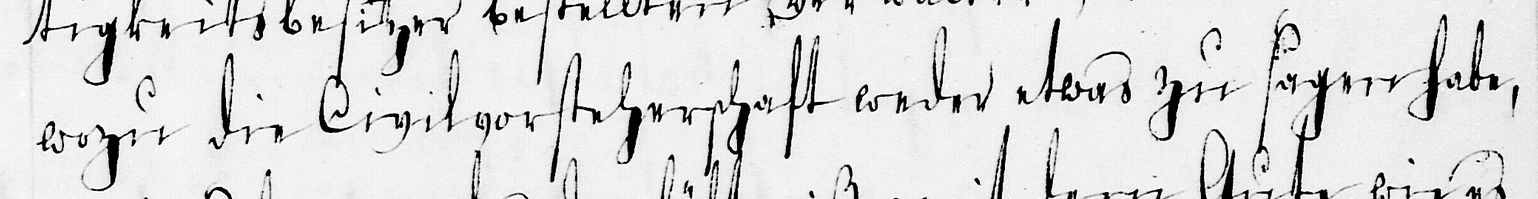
wozu die Civilvorsteherschaft weder etwas zu sagen habe,
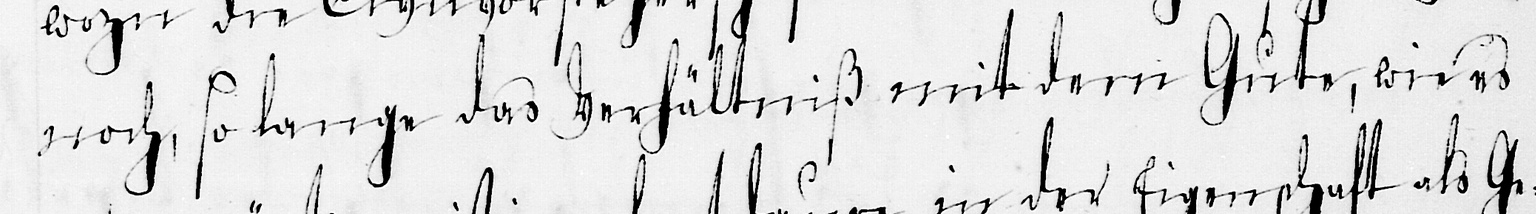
noch, solange das Verhältniß mit dem Gute, wie es
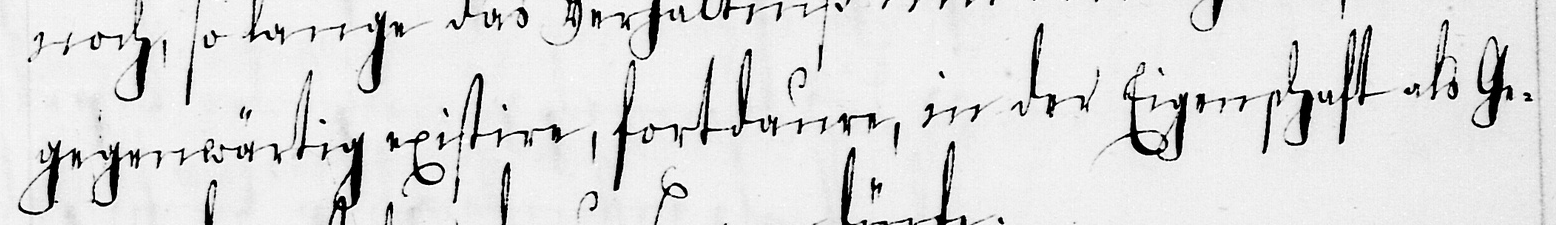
gegenwärtig existire, fortdaure, in der Eigenschaft als Ge¬
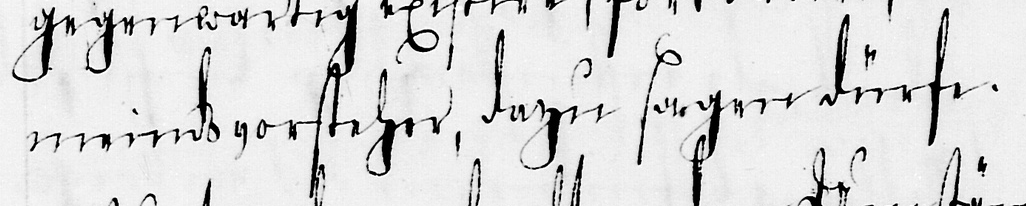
meindsvorsteher, dazu sagen dürfe.
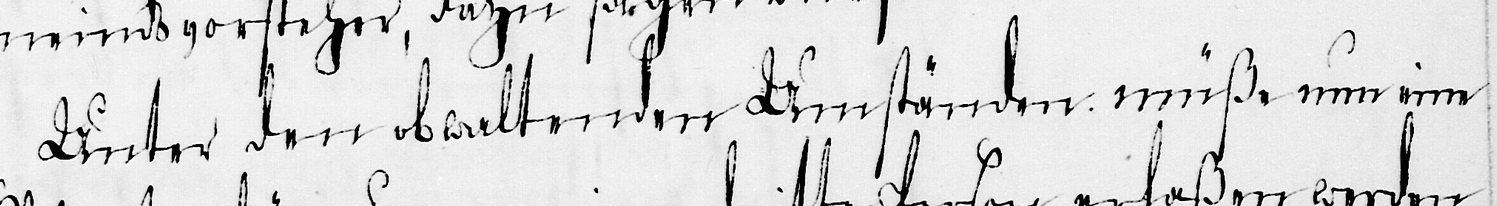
Unter den obwaltenden Umständen müße nun eine
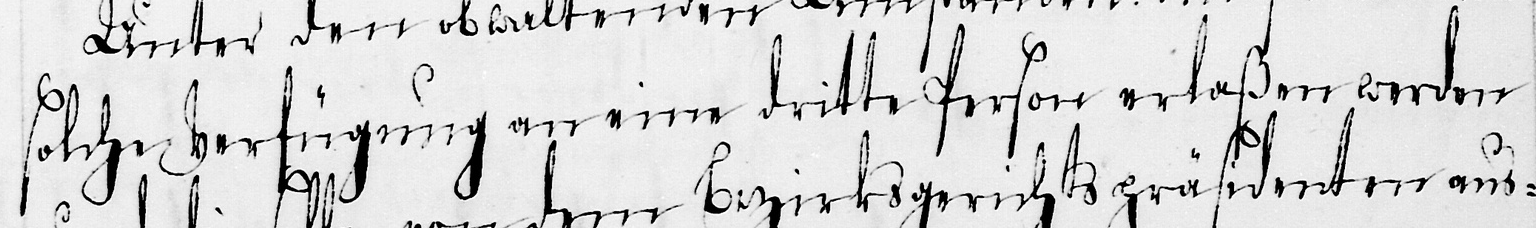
solche Verfügung an eine dritte Person erlaßen werden
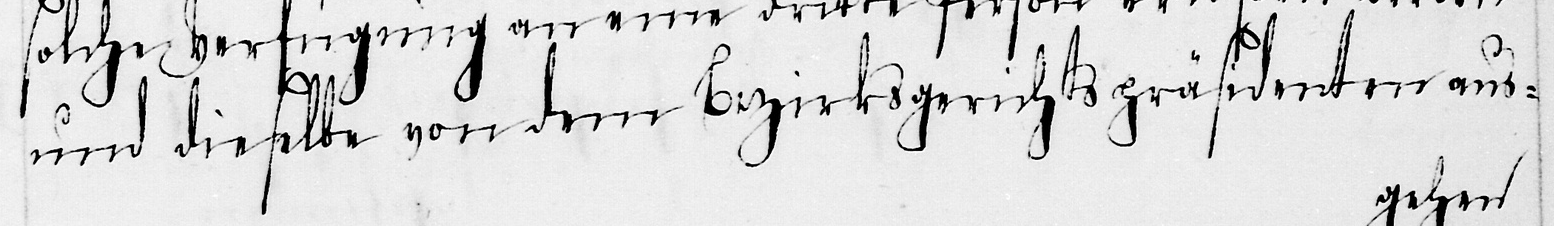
und dieselbe von dem Bezirksgerichtspräsidenten aus-
